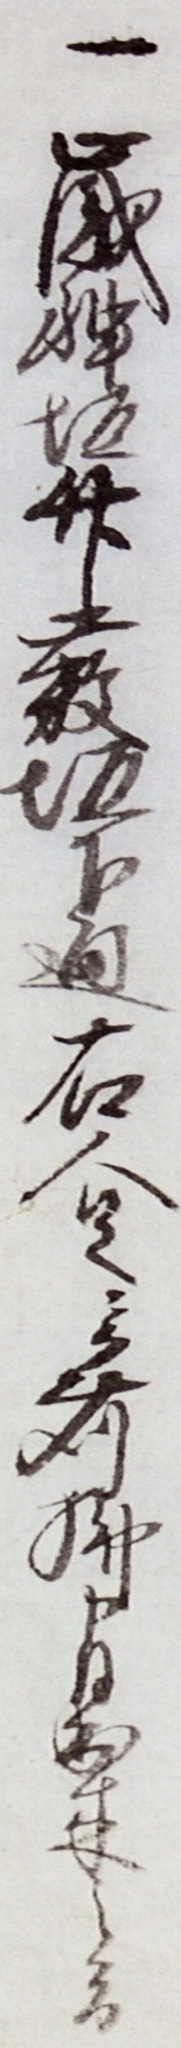一御歳神植竹藪坂下通右人足ニ而刈払申付出来候旨
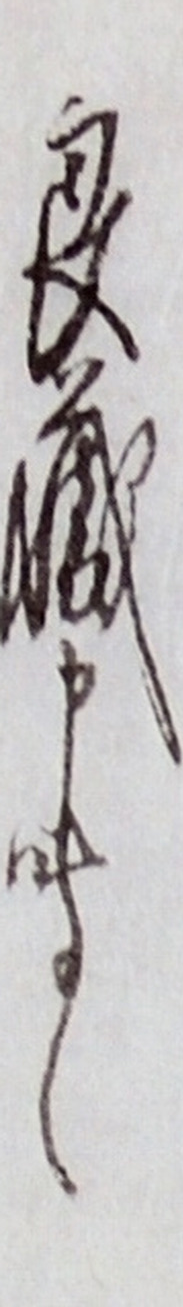良蔵申聞候
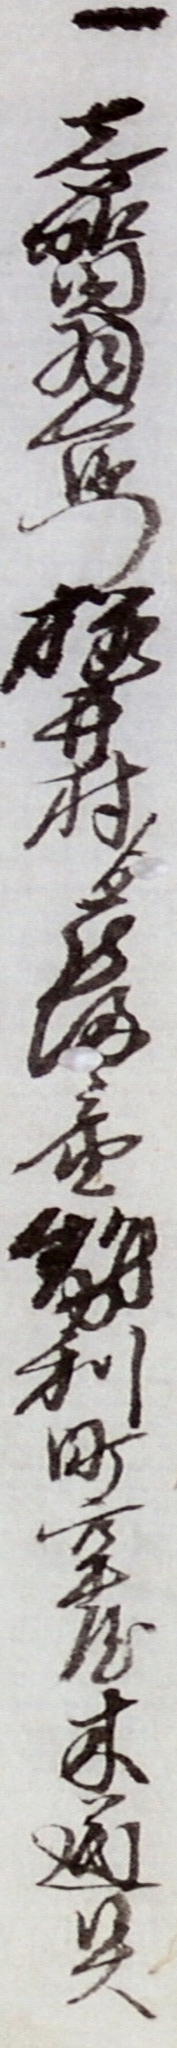一志賀羽右衛門桜井村より被帰候届勢利町牢屋木道具
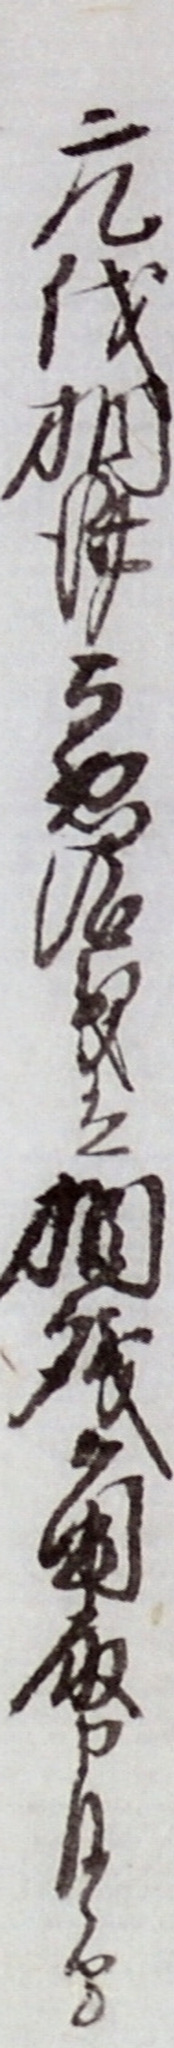元〆相済与惣治義は相残候用取申付候由
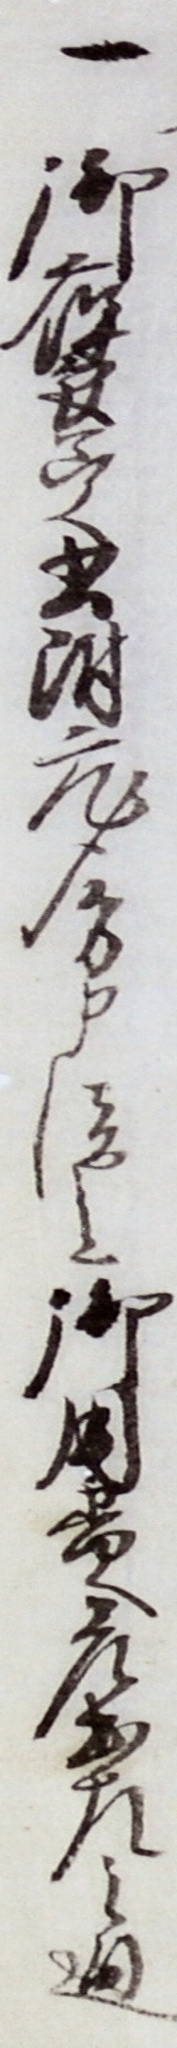一御褒美書附元〆方申談上御用番へ差出左之通

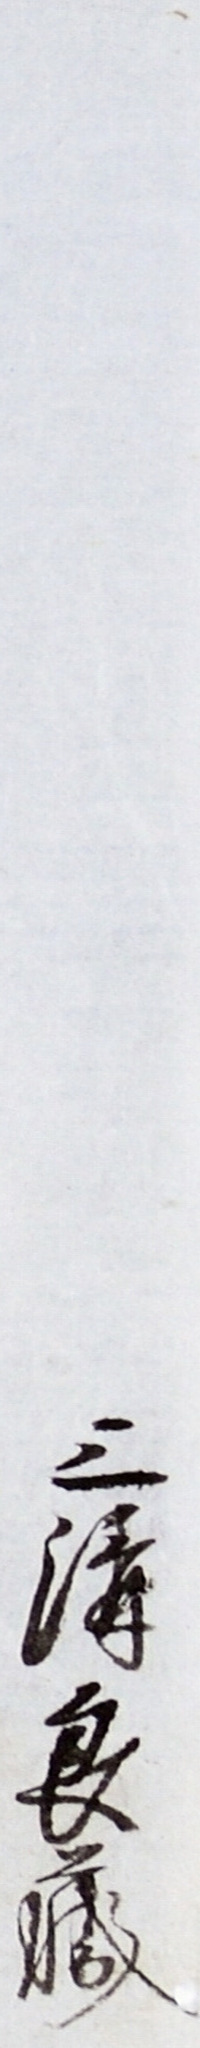三溝良蔵
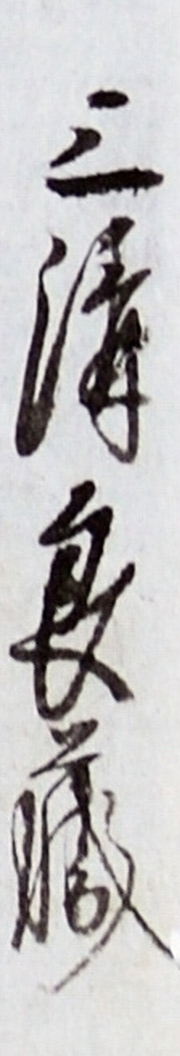三溝良蔵
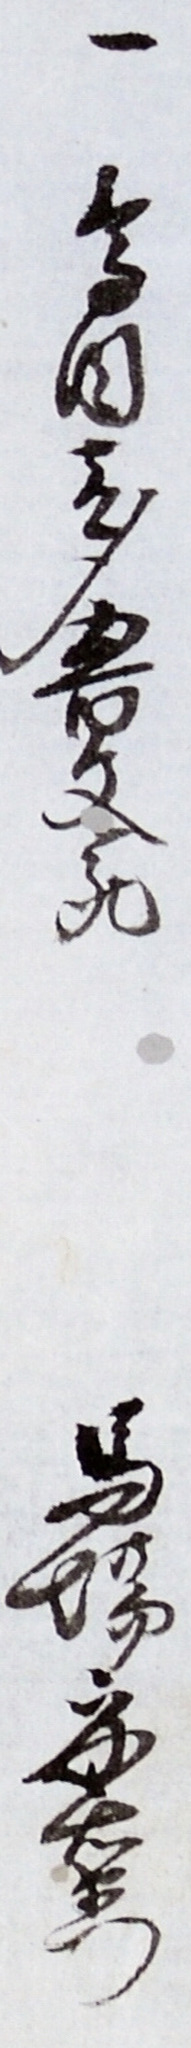一高目壱〆五百文宛馬場安右衛門
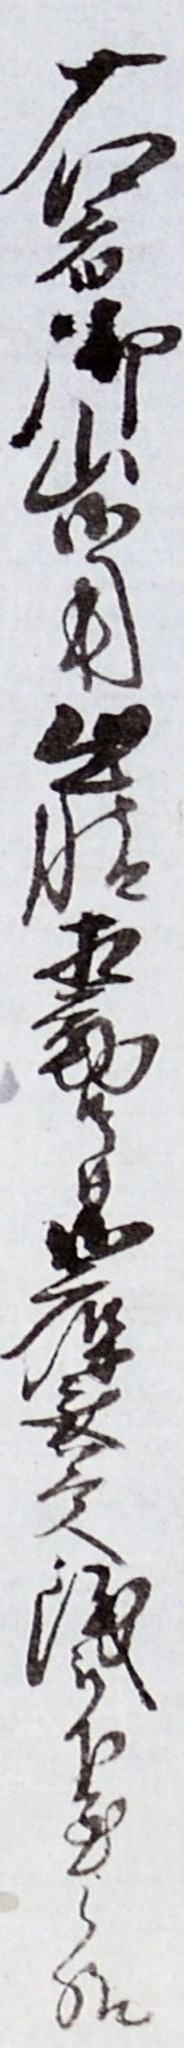一右者御山御用出情相勤候ニ付御褒美銭被下置候様
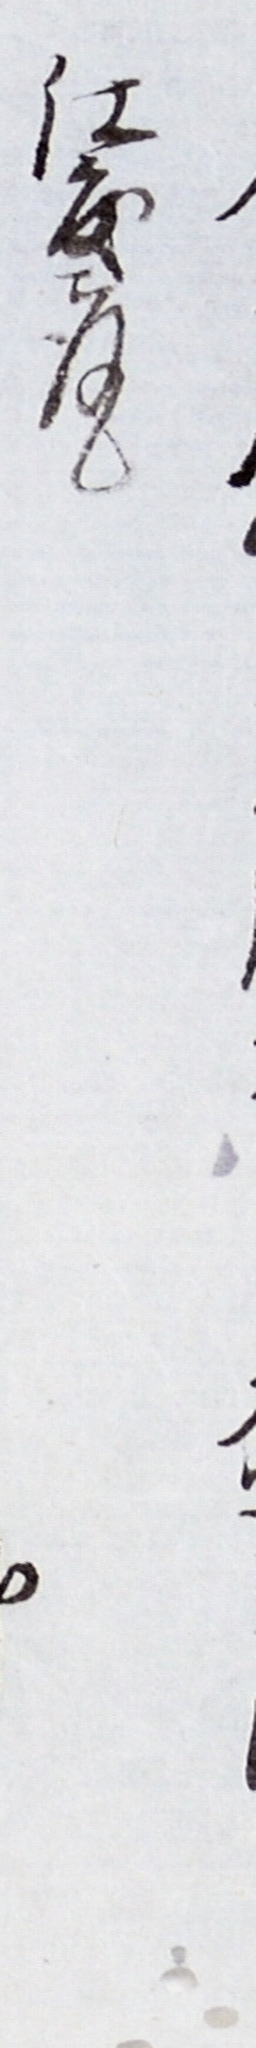仕度奉存候
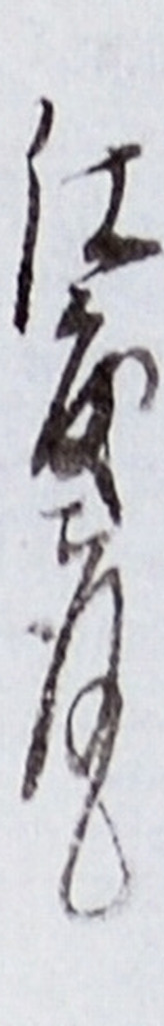仕度奉存候
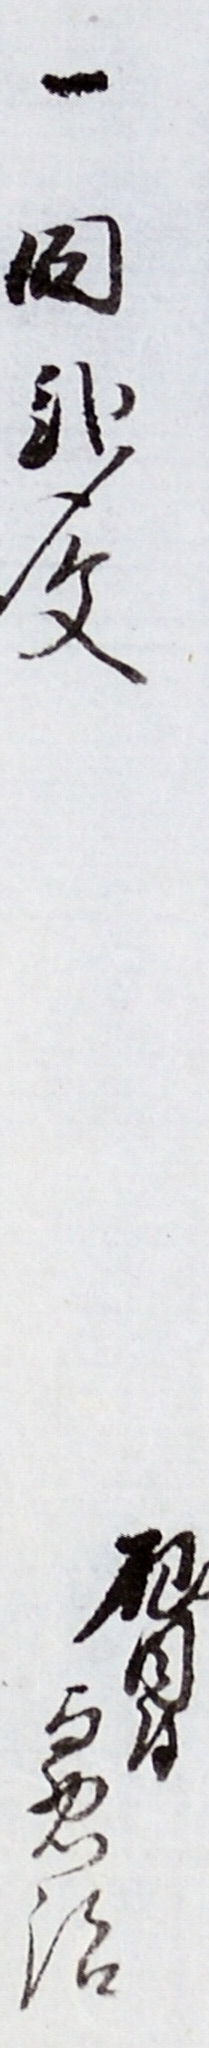一同弐貫文与惣治
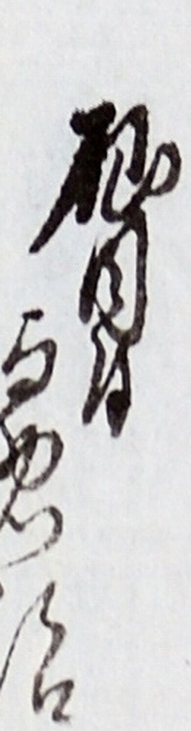杣目付
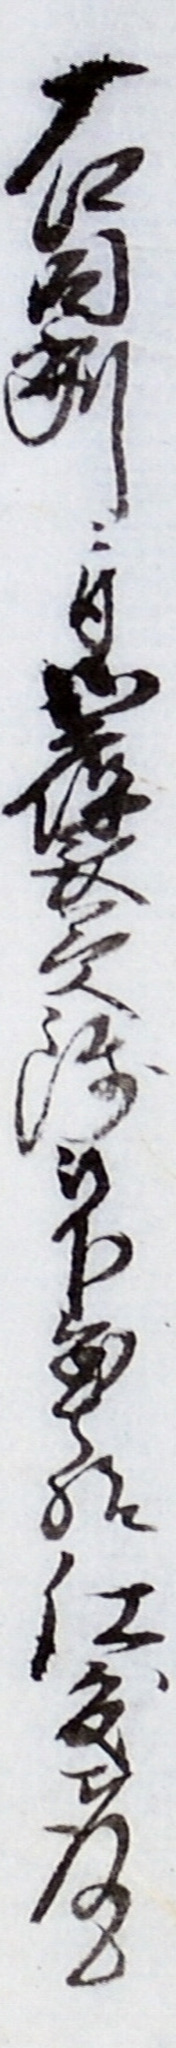右同断に付御褒美受銭被下置候様仕度奉存候
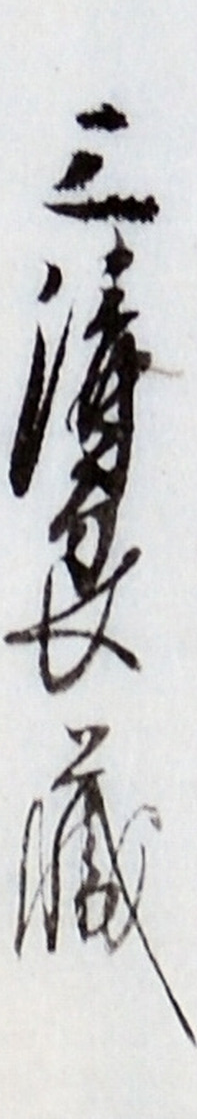三溝良蔵
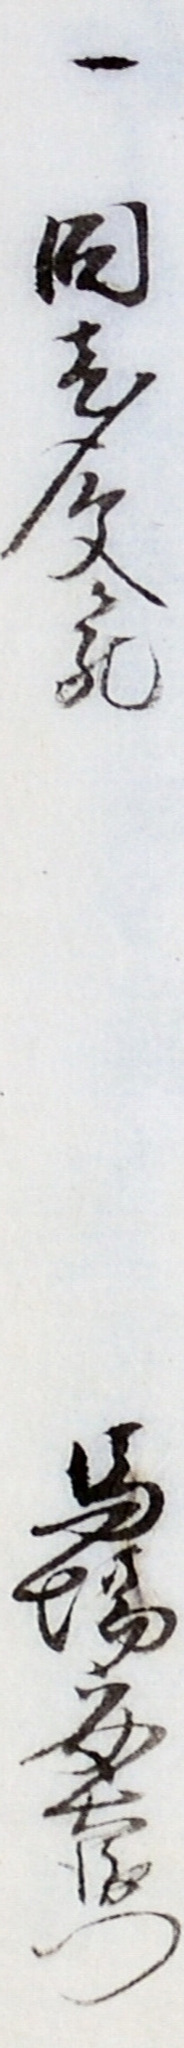一同壱人宛馬場安右衛門
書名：御山奉行御用控
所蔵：伊那市立高遠町図書館・合同会社AMANE
